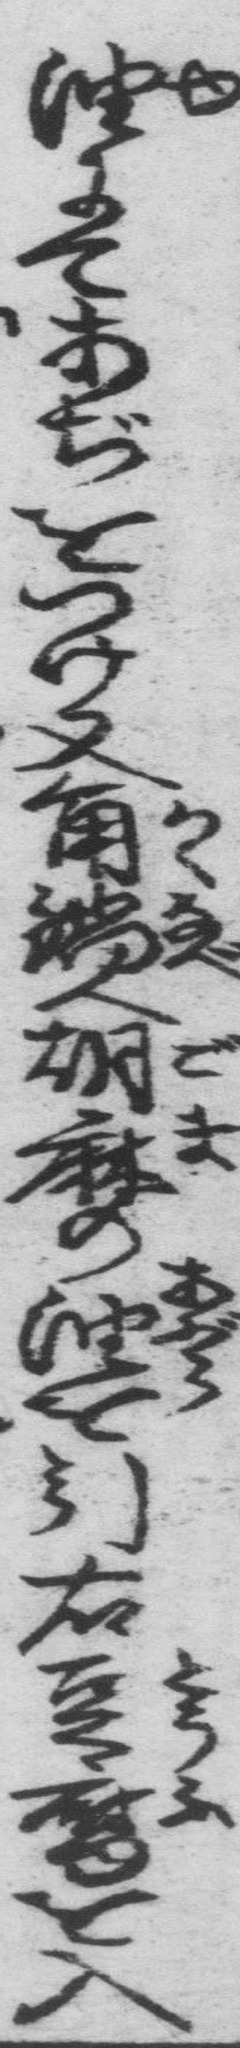油にてあぢをつけ又角鍋へ胡麻の油引右豆腐を入
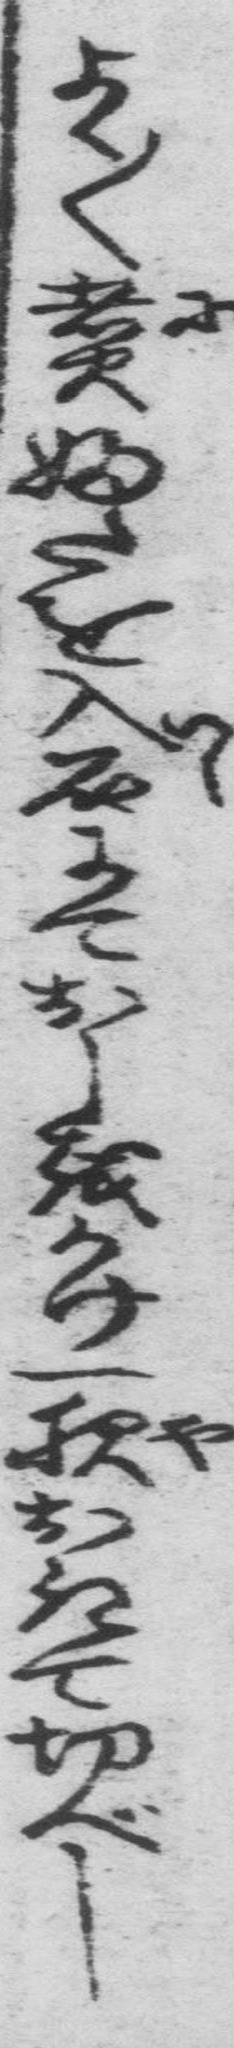よく〳〵煮ふたを入石にておしをかけ一夜おきて切べし
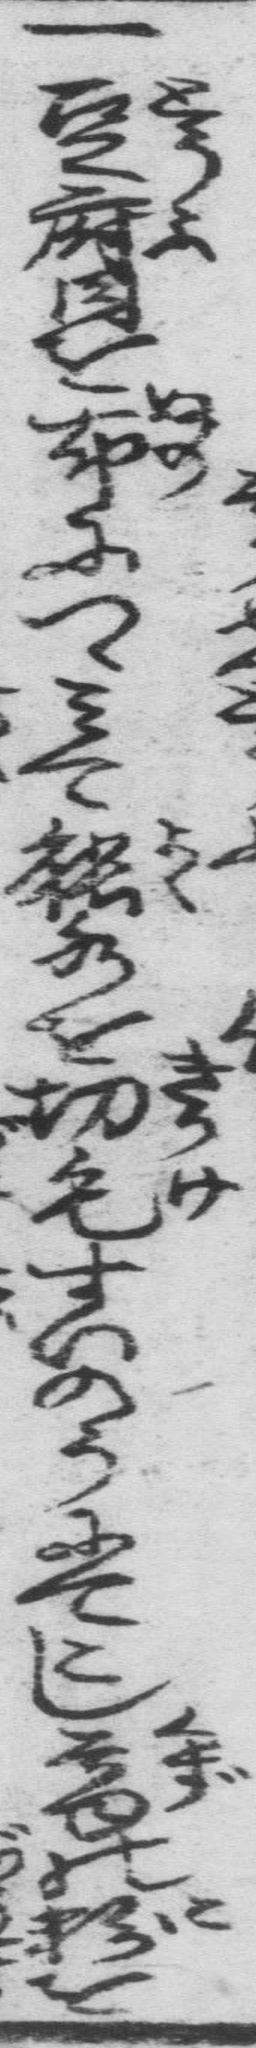一豆腐を布につゝミて能水を切毛すいのうにてこし葛の粉を
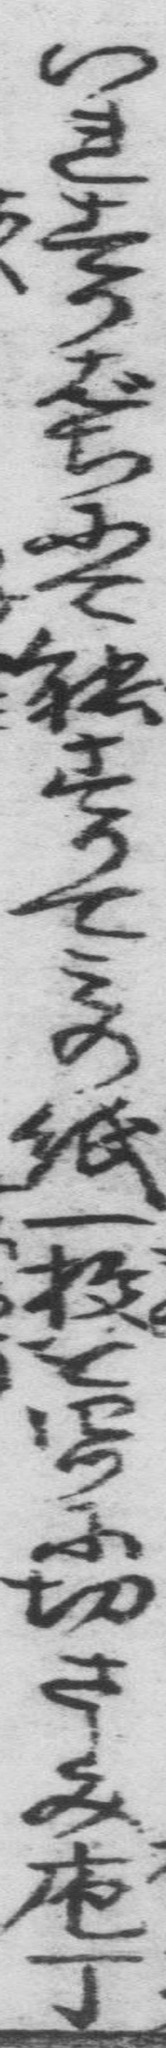いれすりばりにて能すりてミの紙一枚を四ツに切さしみ包丁
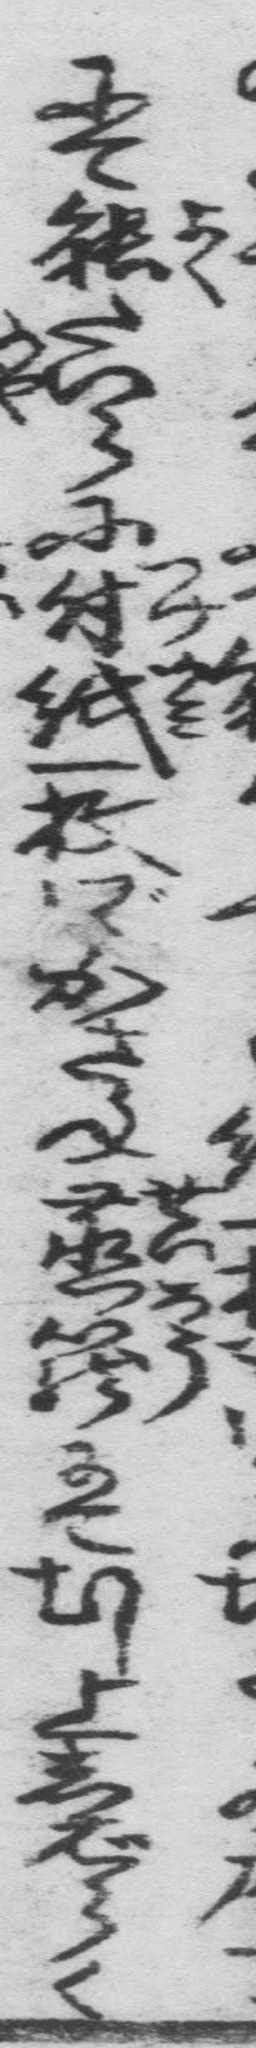にて能たいらに付紙一枚づゝかさね蒸籠にてむし上しばらく
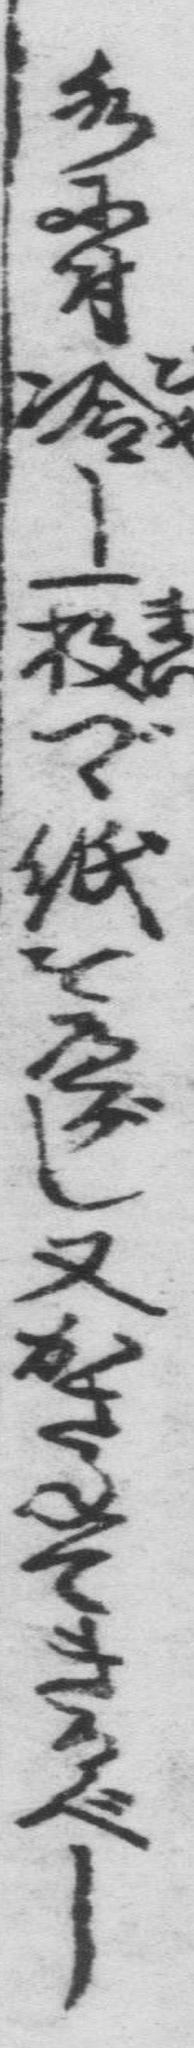水に付冷し一枚づゝをへがし又かさねてきるべし
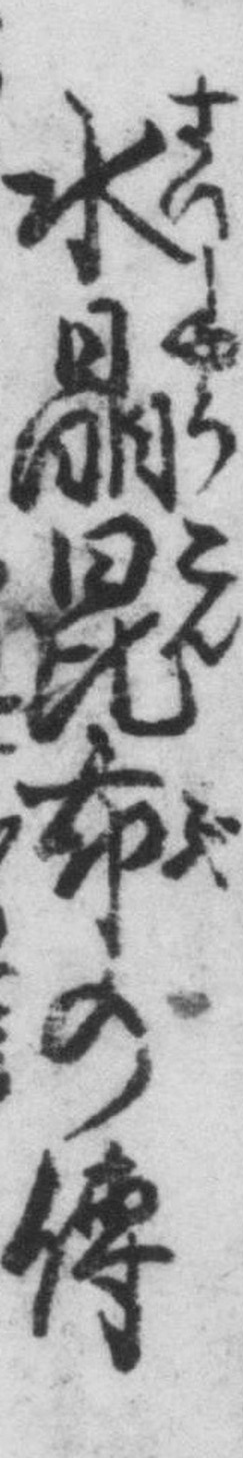水晶昆布の傳
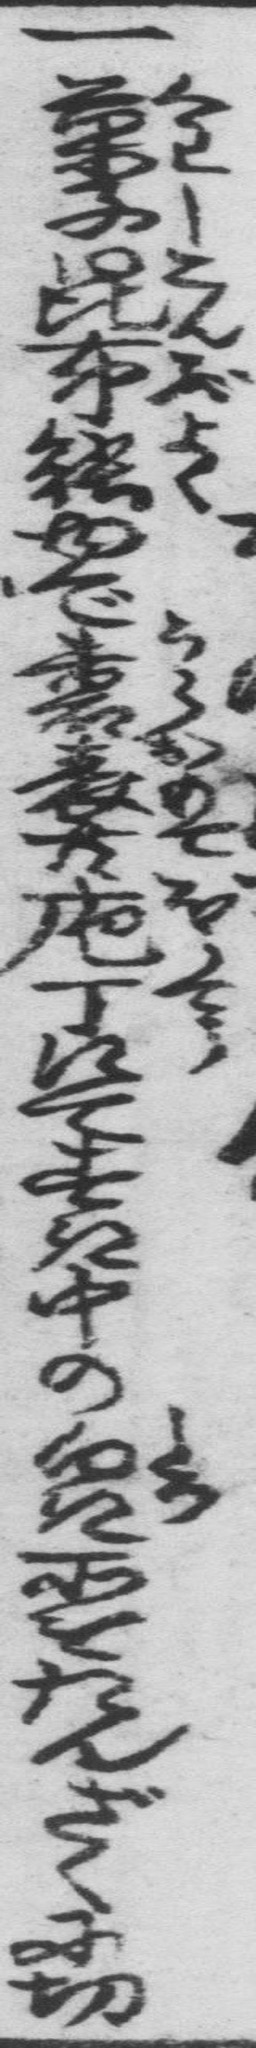一菓子昆布能ゆで裏表庖丁にてすきな中の白き所をたんざくに切
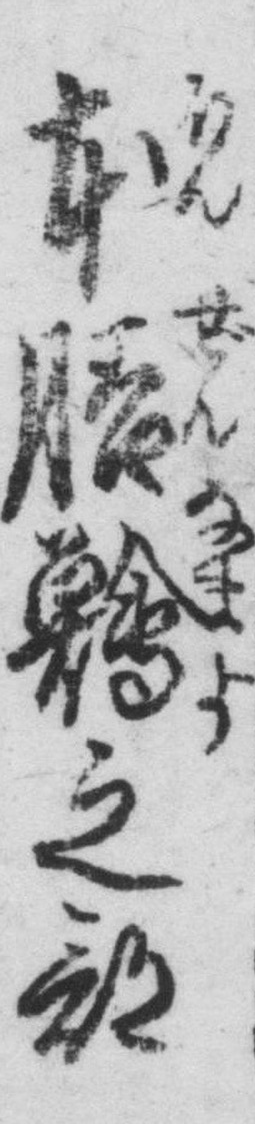本膳鱠之部
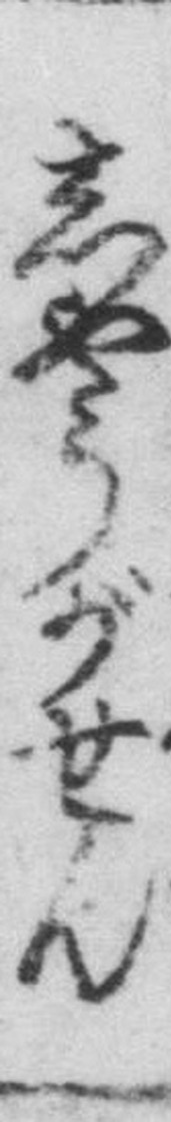しやうがせん
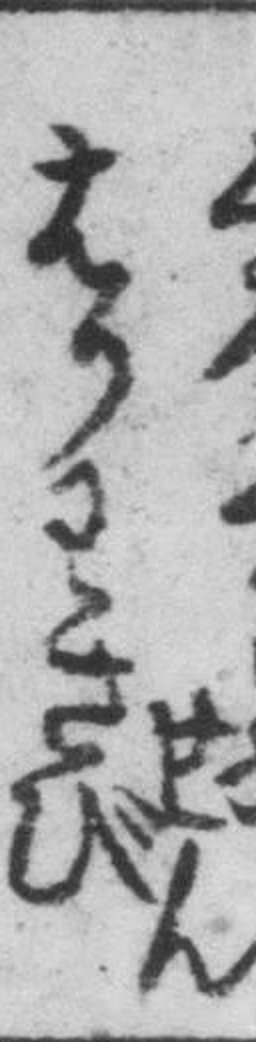はりわさび
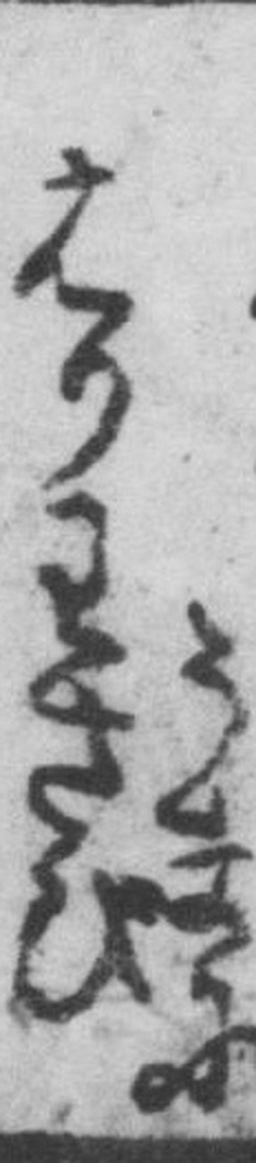はりわさび

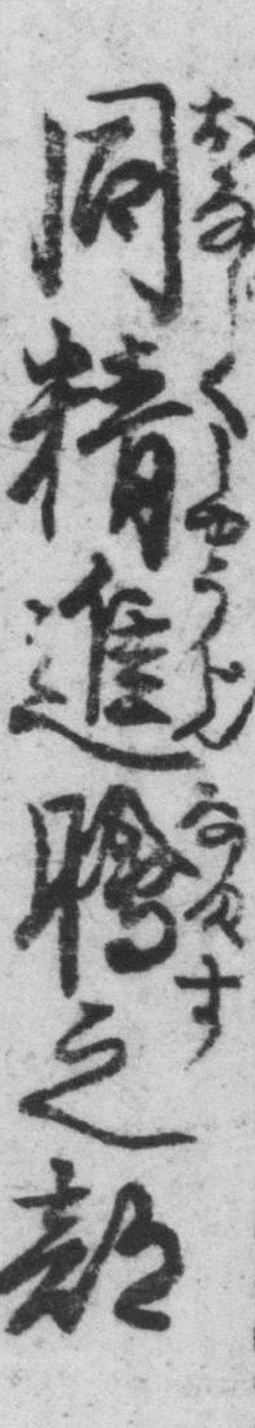同精進鱠之部
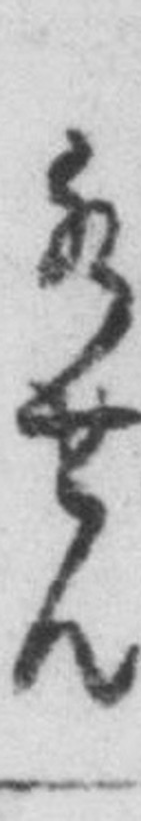長せん
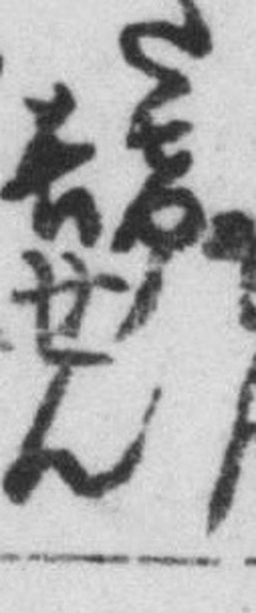長せん
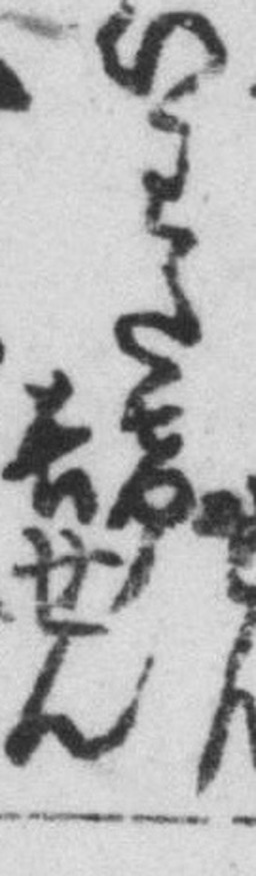長せん
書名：即席庖丁
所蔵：大阪府立大学学術情報センター 国文学研究資料館
